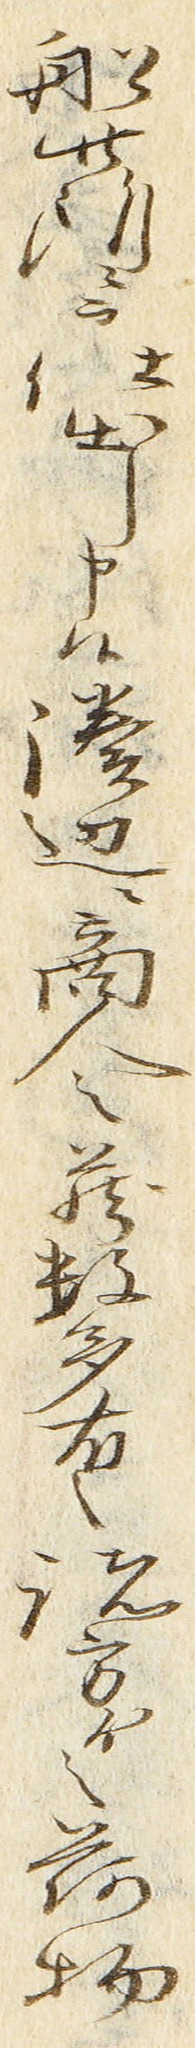船此所に而仕出し申候湊辺に商人の蔵多有之諸方ゟ之荷物
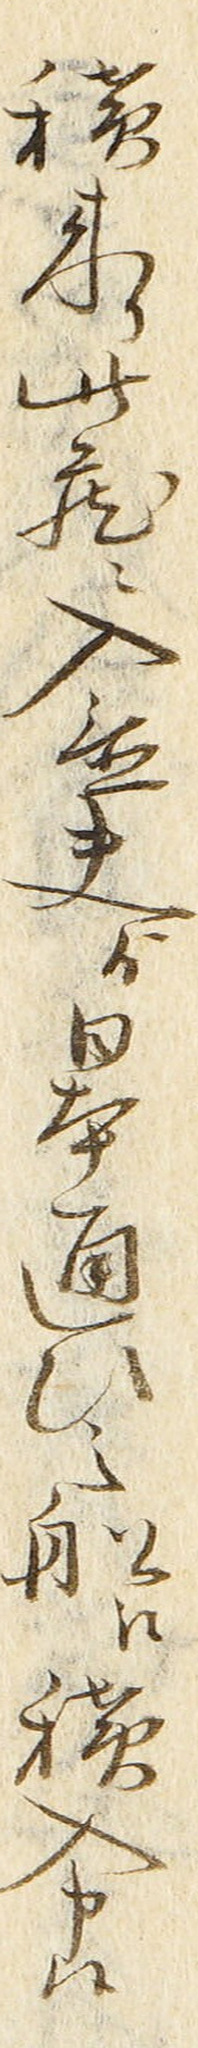積来り此蔵に入置夫ゟ日本通ひ之船江積入申候
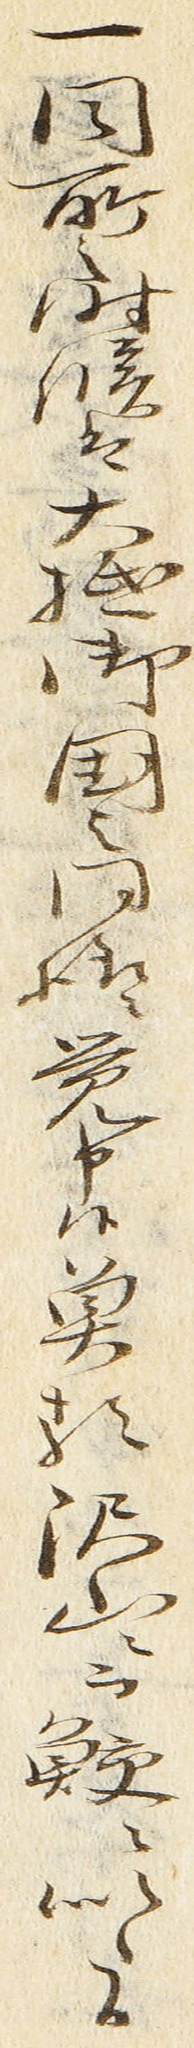一同所之時候は大抵御国と同様に覚も申候魚類沢山に而鰻に似たる
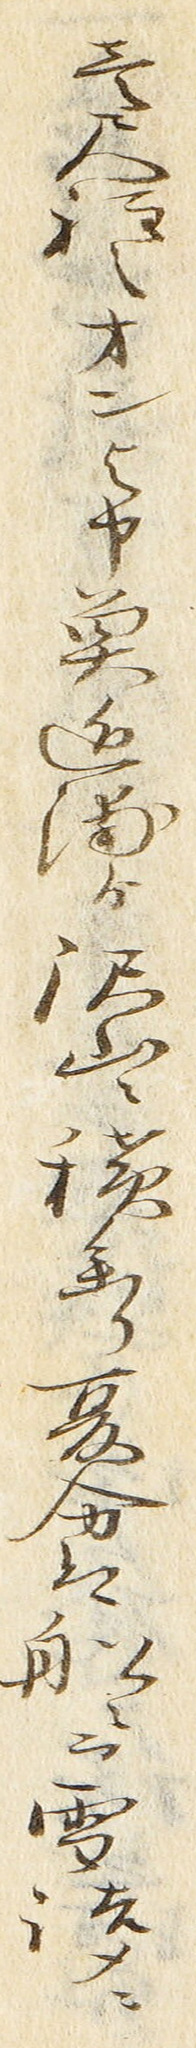壱尺程之オンと申魚近浦ゟ沢山に積参り夏分は船に而雪詰めに
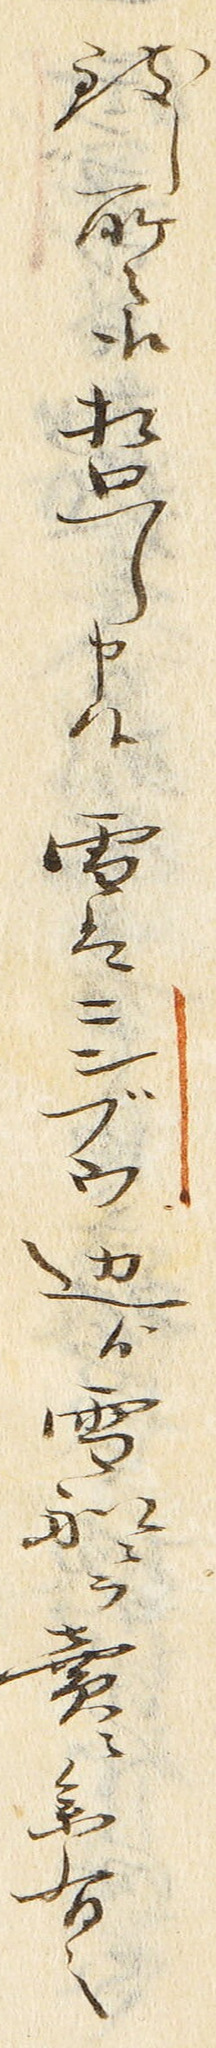致し所々取相廻し申候雪はニンブウ辺ゟ雪船に而売に参有之
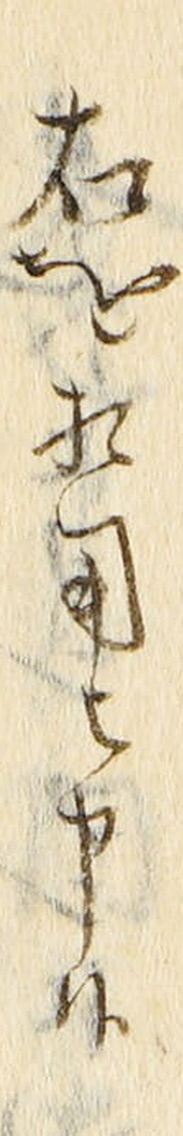右を相用と申候
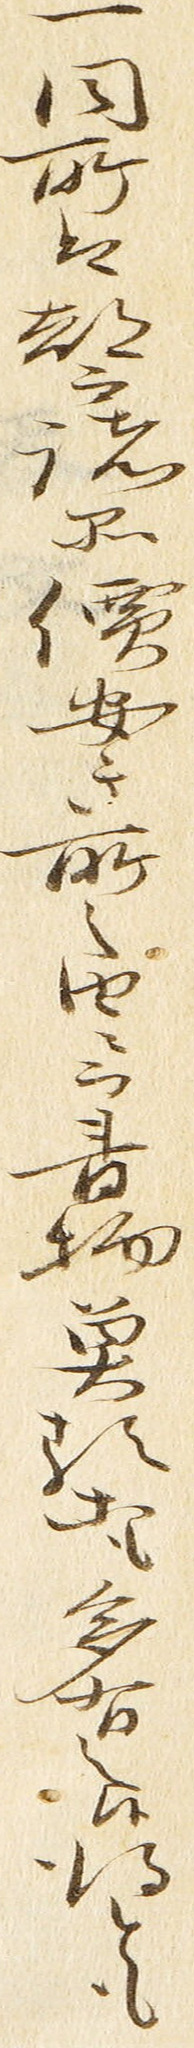一同所は都而諸品価安き所之由に而青物魚類等も多有之候得とも
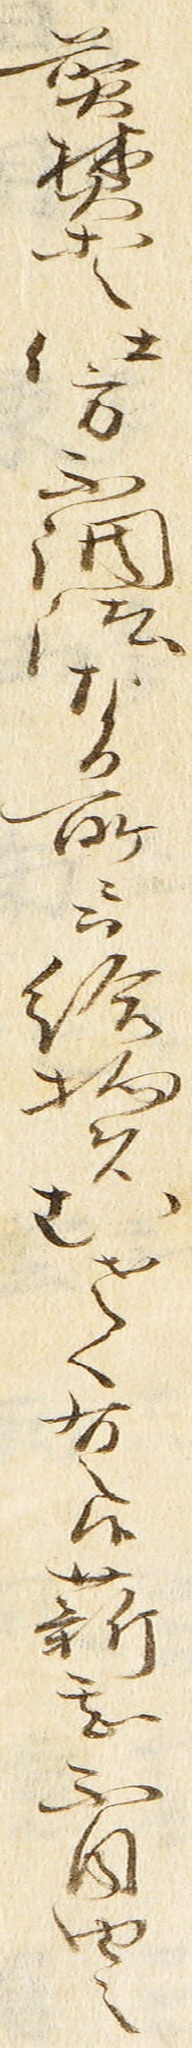？焚等の仕方不調法なる所に而給物はむ？く有之候薪甚不自由之
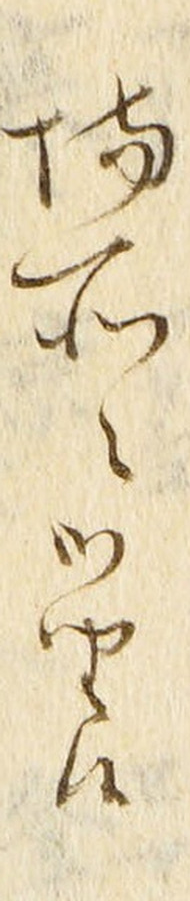場所に御座候
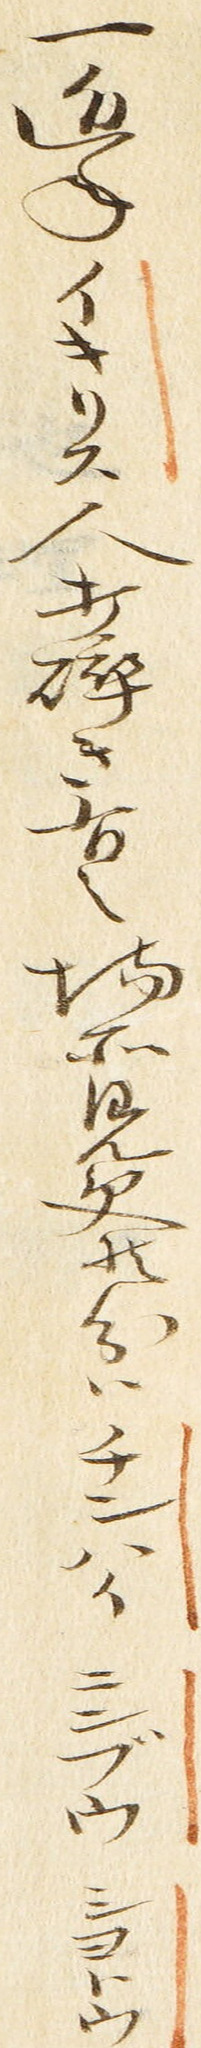一近年イキリス人打砕き有之場所見受候分はチンハイニンブウシヨトウ
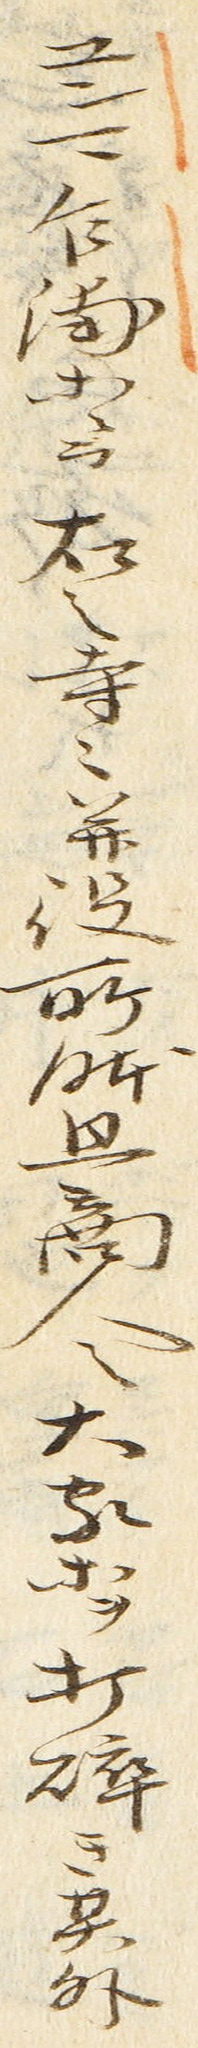ユンマ乍浦等に而右之寺々並役所躰且商人之大家等ヲ打砕き其外
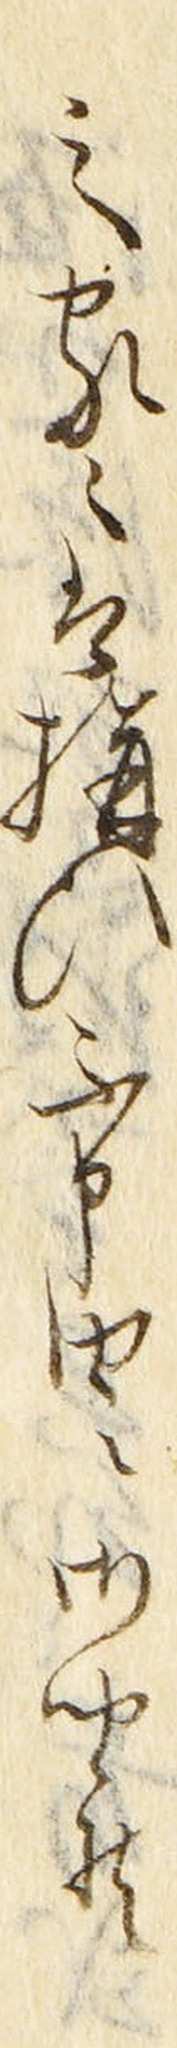之家々は損ひ不申由に御座候
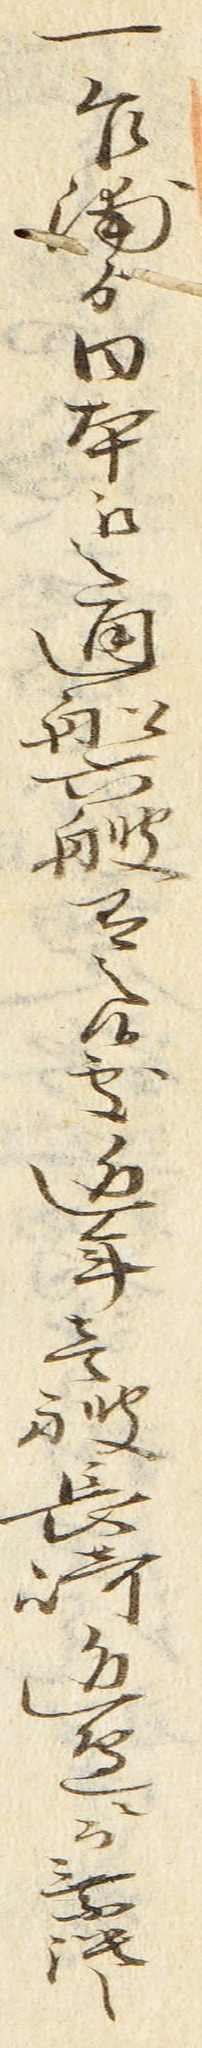一乍浦ゟ日本江之通船六艘有之候處近年壱艘長崎近辺に而乗潰し
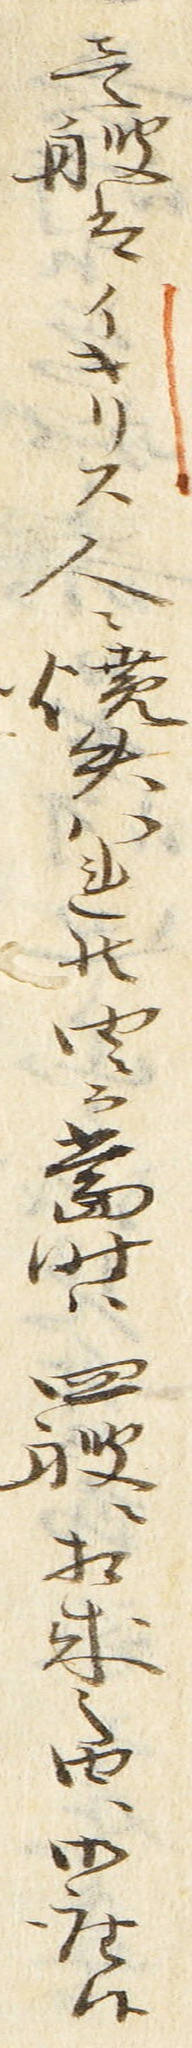壱艘はイキリス人に焼失はれ候由に而当時は四艘に相来の由に御座候

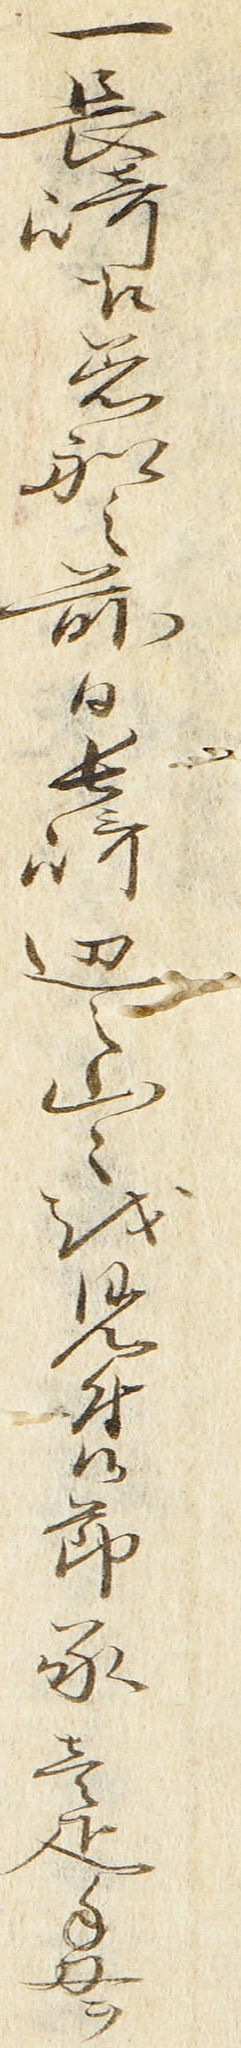一長崎江着船之前日長崎辺之山々越見付候節豕壱疋手？ヲ
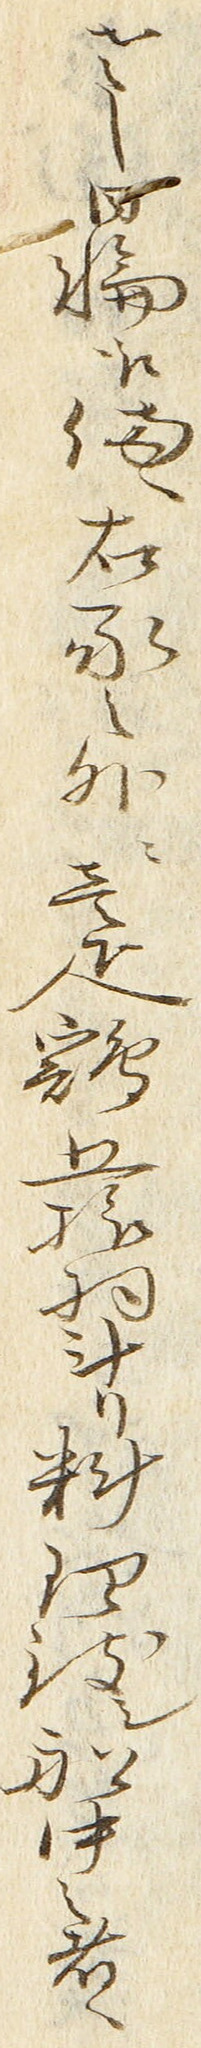さし日輪江倆へ右豕之外に壱疋鶏五拾羽斗り料理致し船中之者へ
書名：長崎漂流記
